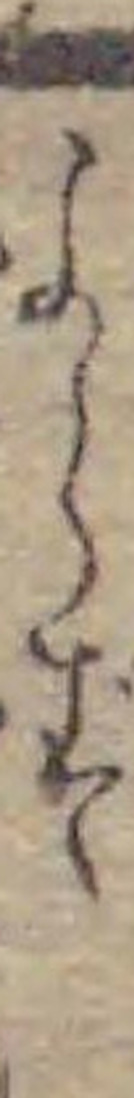よらず
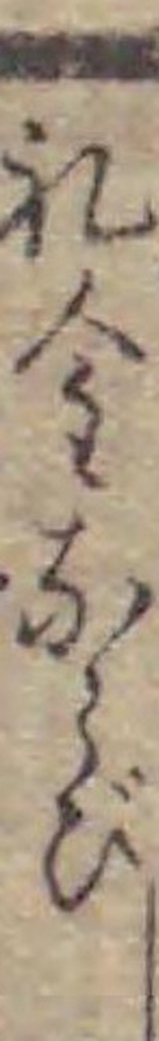礼金ならび
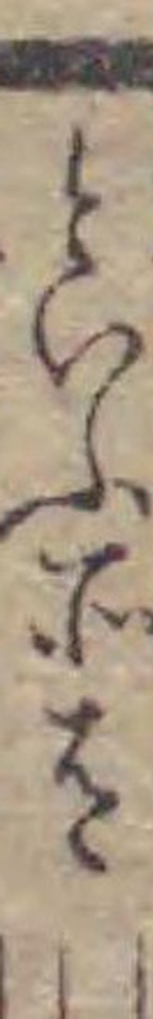といふ所を
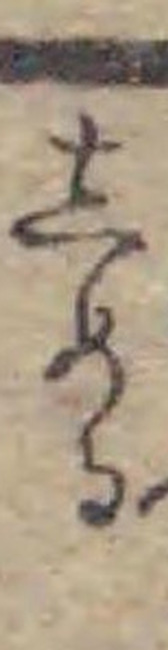しめる

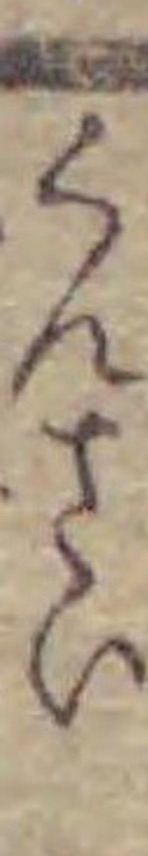くんさい
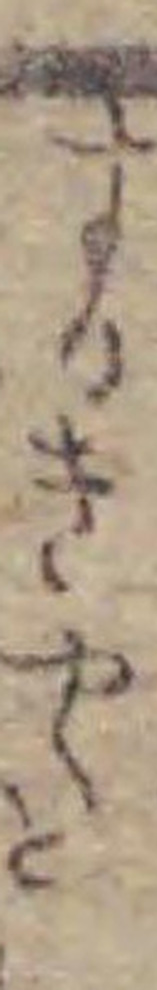するきやくを
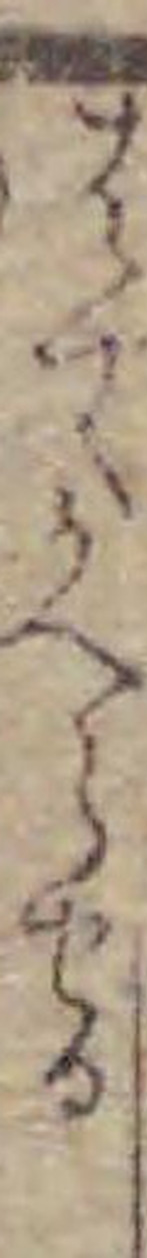はやくかへらせる
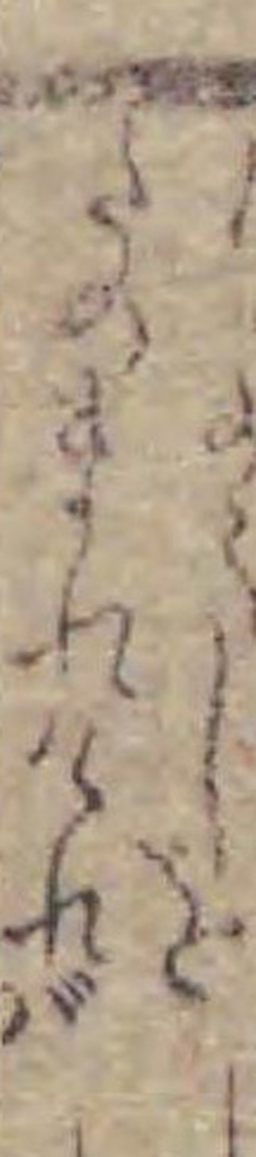たのまれければ
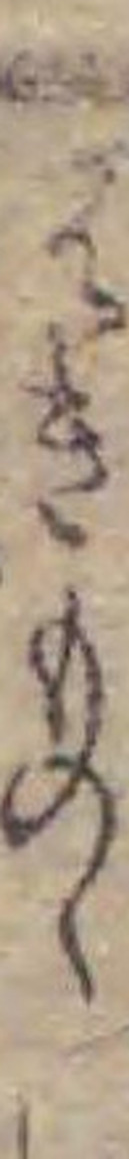はきものゝ
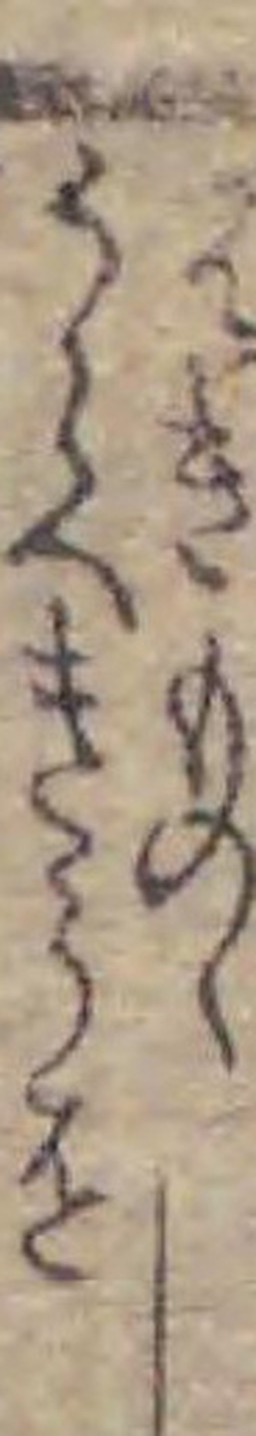うらへきうを
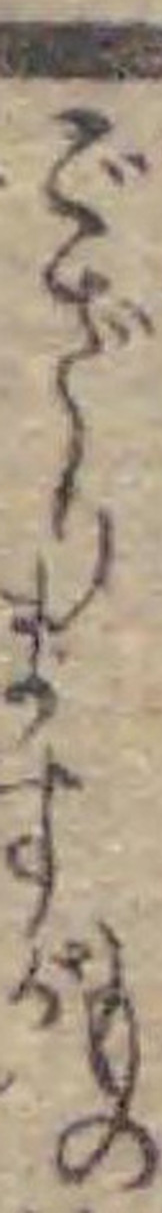ござりますが
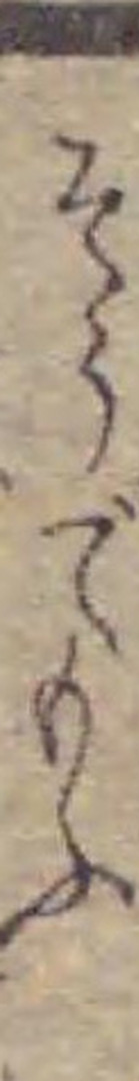そうでもふ
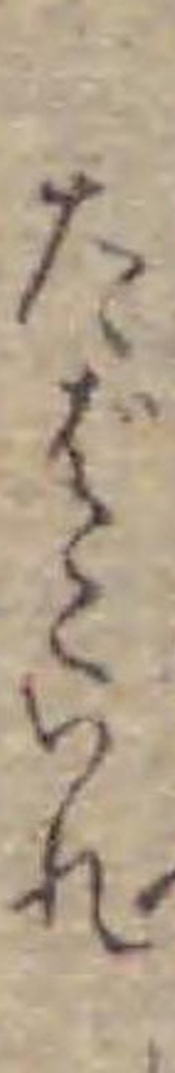たばこいれ
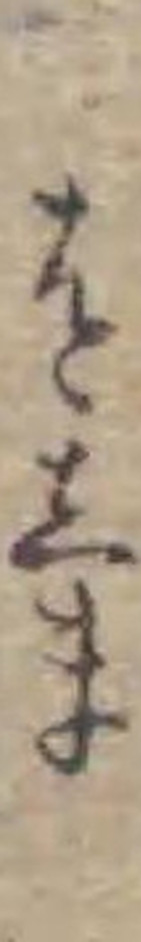をしま
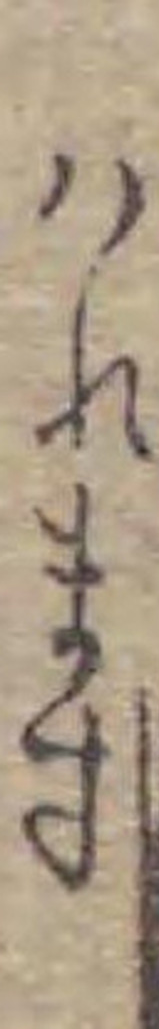はれます
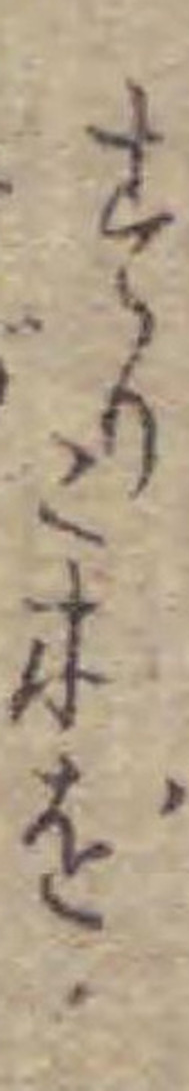すりこ木を
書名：江戸花俳優贔屓 : 3巻
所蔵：国立国会図書館 National Diet Library, JAPAN
